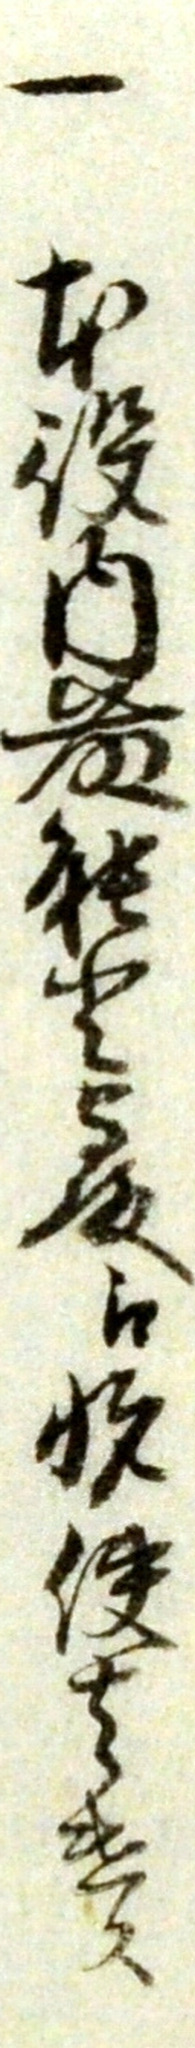一本役内藤能登守殿江悦使者遣ㇲ
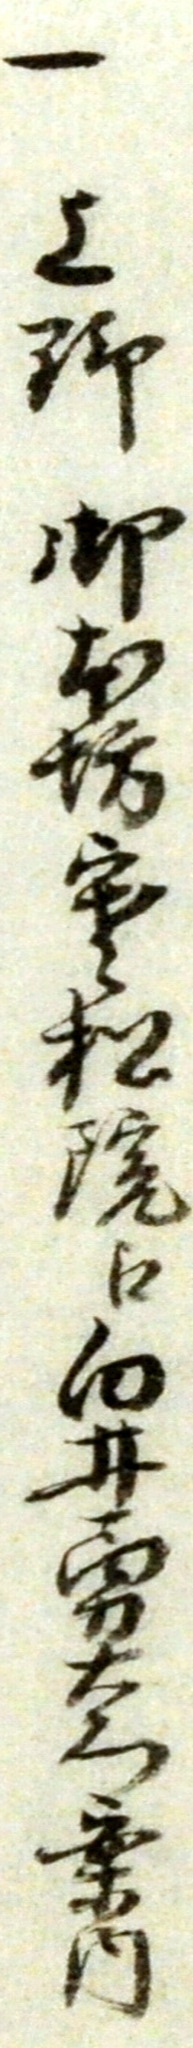一上野御本坊寒松院江白井勇右衛門案内

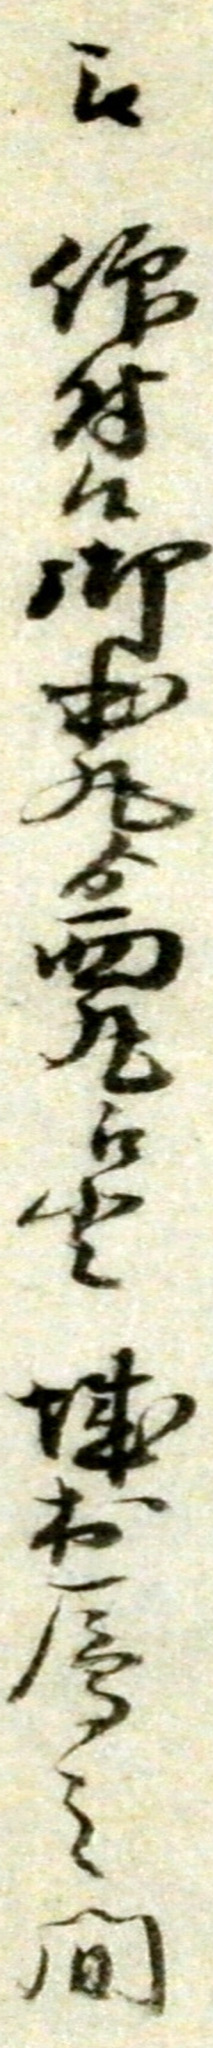被仰付候御出丸ゟ西丸江登城於雁之間
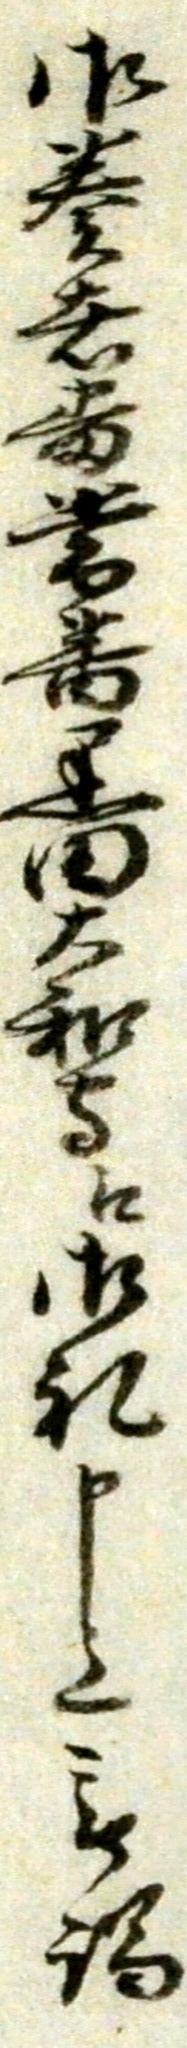御奏者番常番黒田大和守江御礼申上被謁
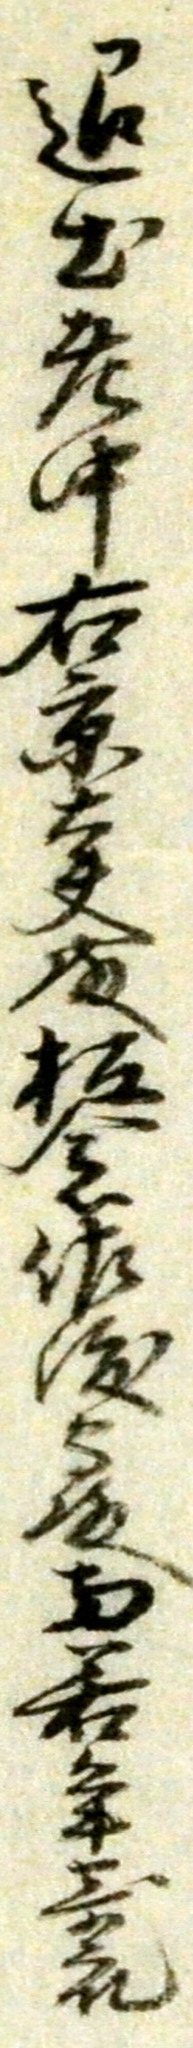退出老中右京太夫殿板倉佐渡守殿両若年寄衆
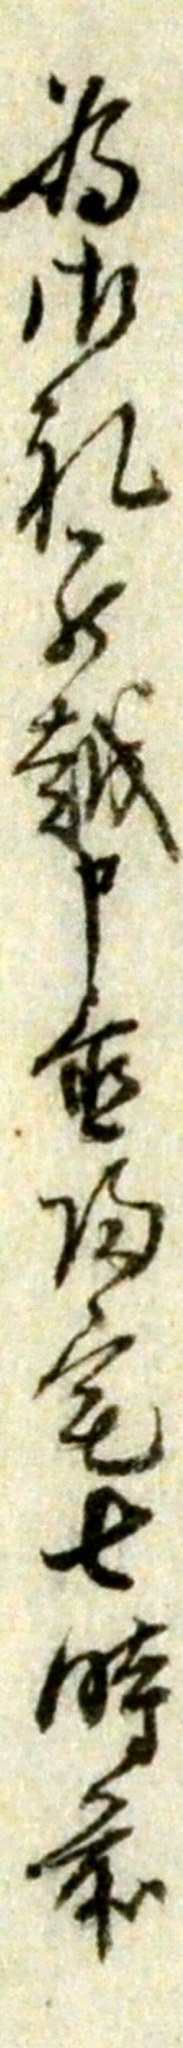為御礼罷越申置帰宅七時前
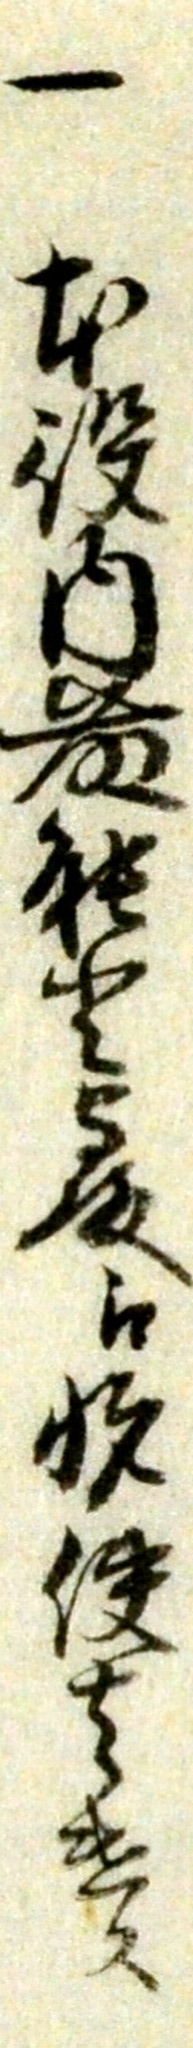本役内藤能登守殿江悦使者遣ㇲ
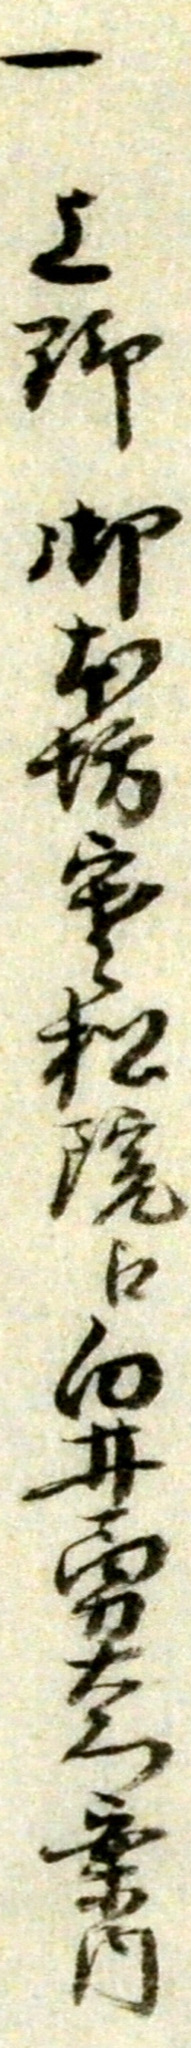一上野御本坊寒松院江白井勇右衛門案内
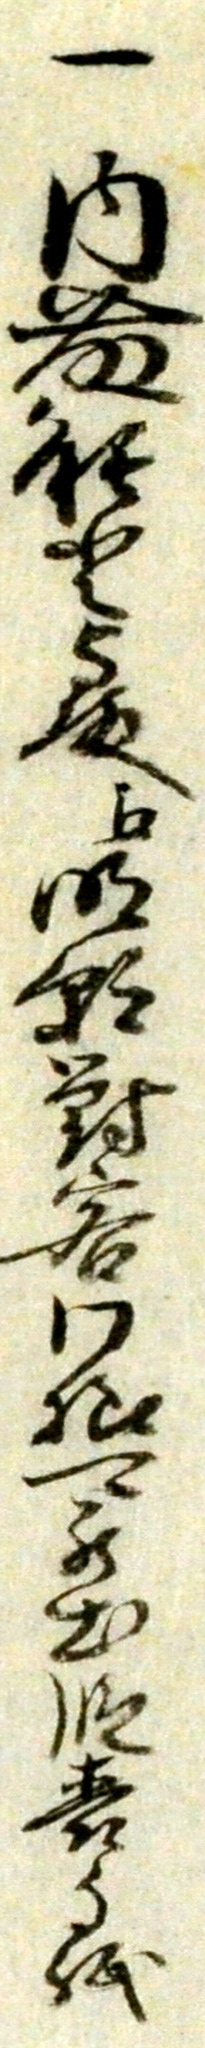一内藤能登守殿江明朝対客同様可罷出段表手紙
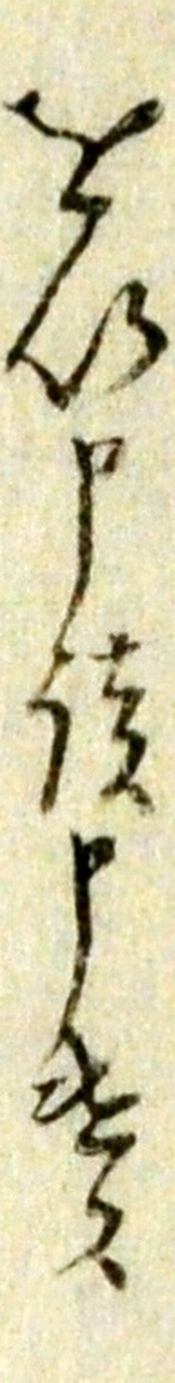を以申談申遣ㇲ
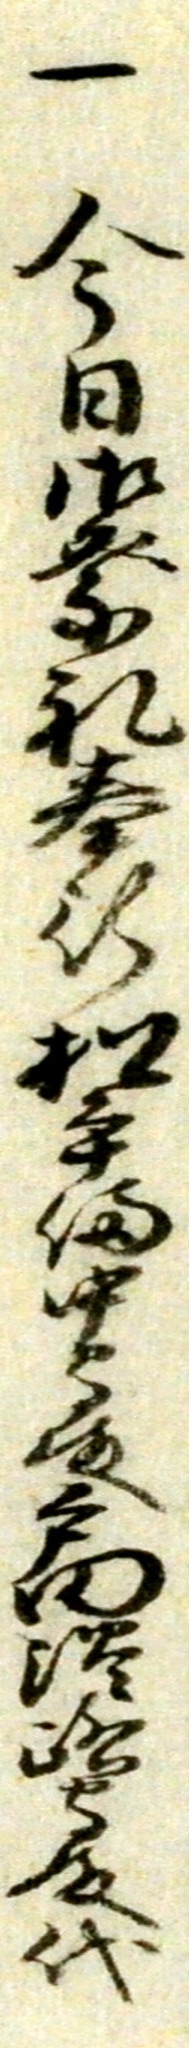一今日御祭礼奉行松平備中守殿戸田淡路守殿代
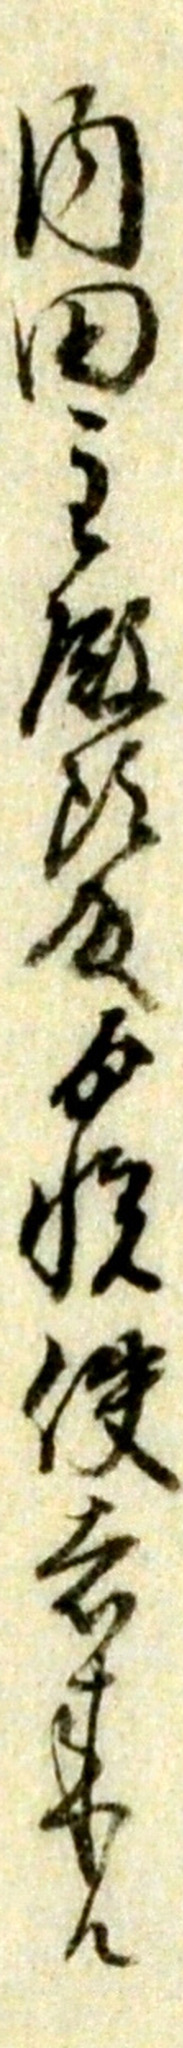内田主殿頭殿ゟ悦使者来ㇽ
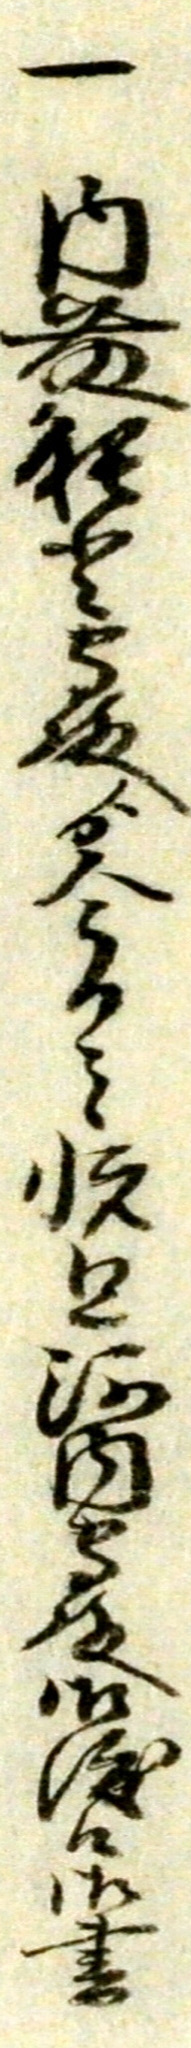一内藤能登守殿ゟ今日之悦且河内守殿御渡候御書
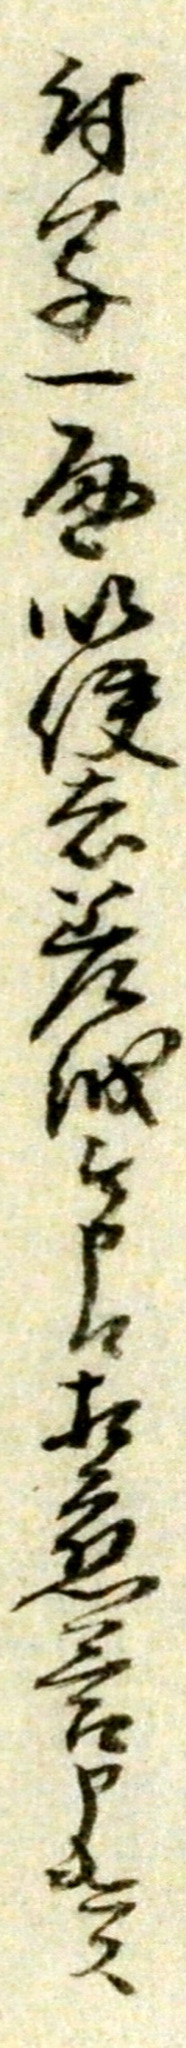付写一通以使者差越被申候相応答申遣ㇲ
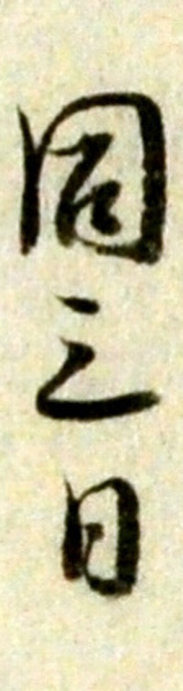同三日
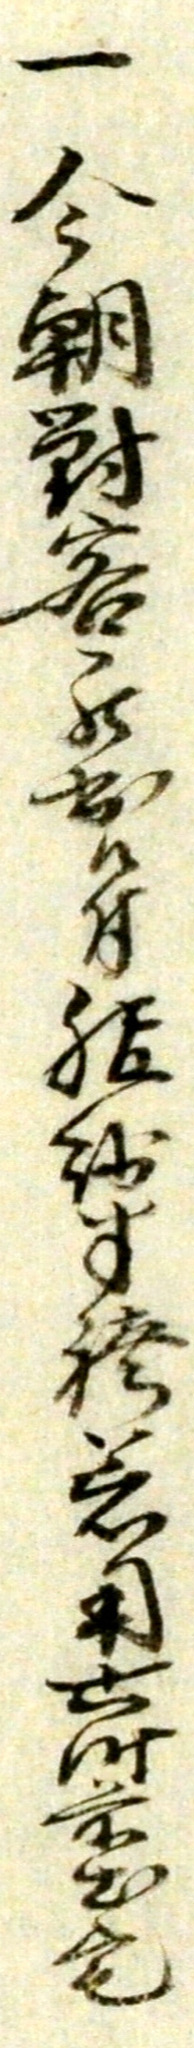一今朝対客罷出候付服紗半袴着用六時前出宅
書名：日光御名代相勤候節ノ留
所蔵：伊那市立高遠町図書館・合同会社AMANE
